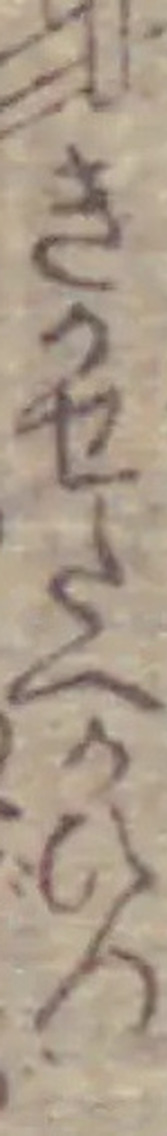きかせたへかひつ
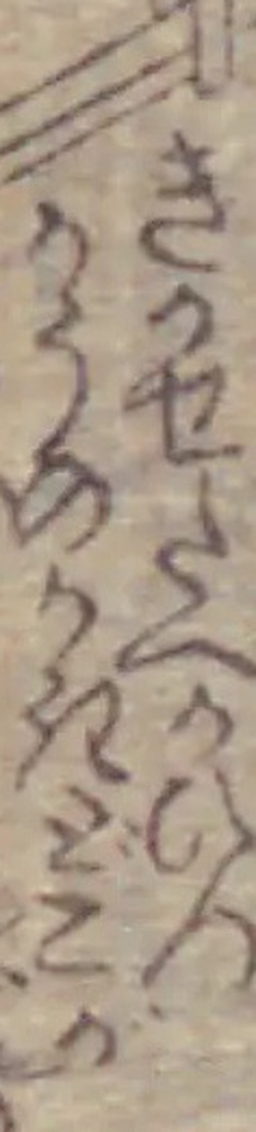かうのかきどこが
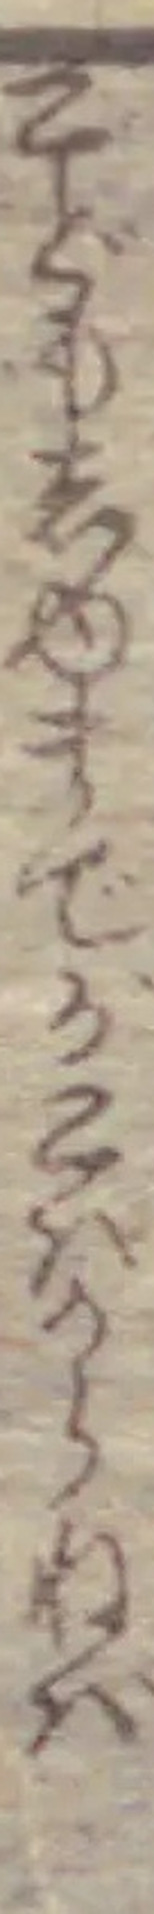こどもしゆまでかこはからねば
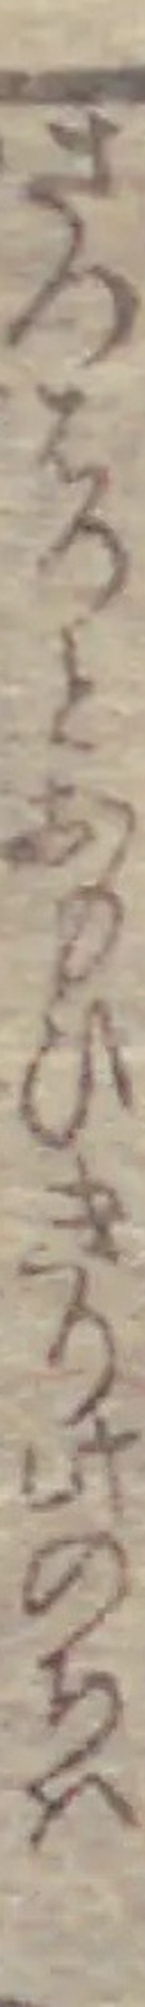さつはりとおもひきり此のちは
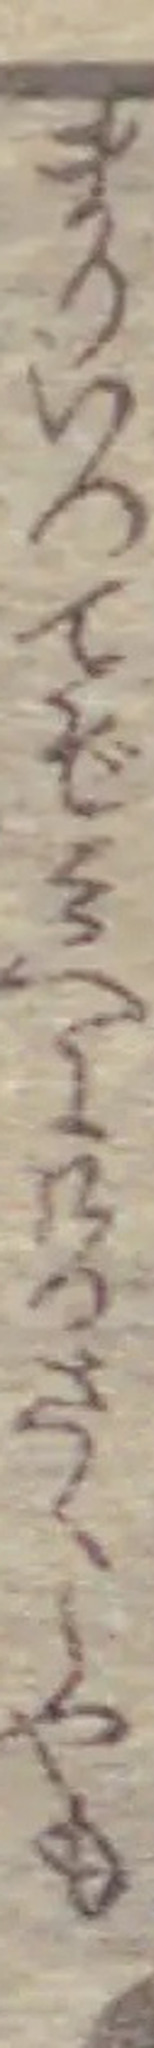まりいつてぞみへにけるさくしやも
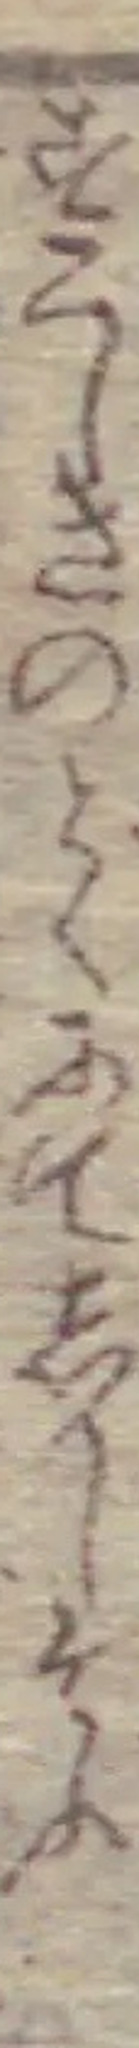すこしきのどくにてしかしそふ
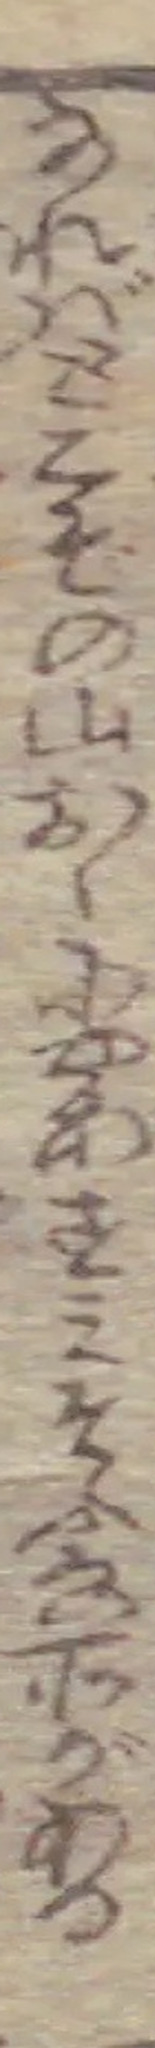なればとこぞの山おくにやあすみそふな所がある
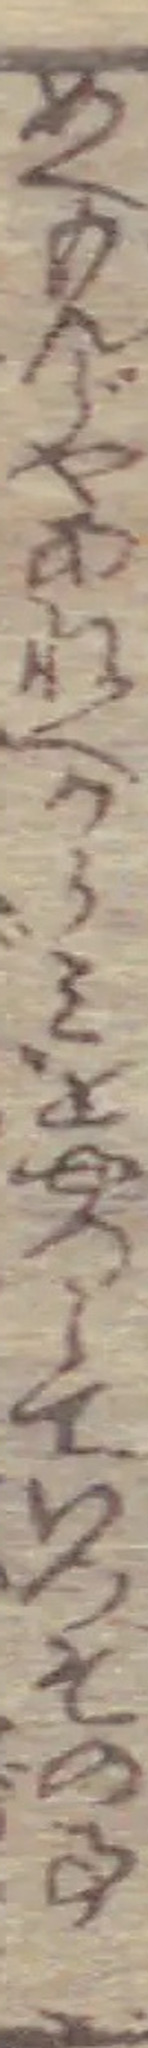めへもんじやあねへからみをやつしていつその事
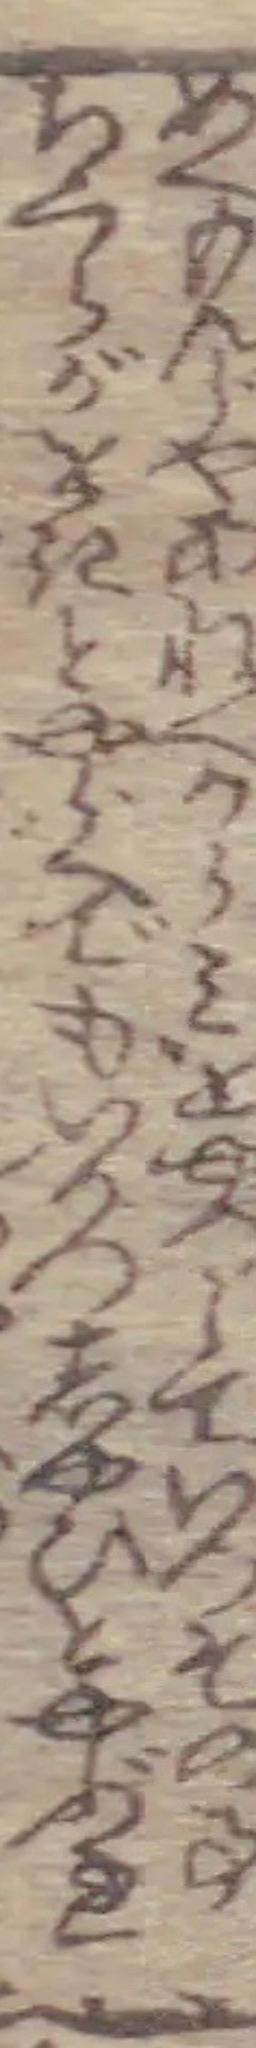ちくらがをきとやらへでもいかつしやひとやぶれ
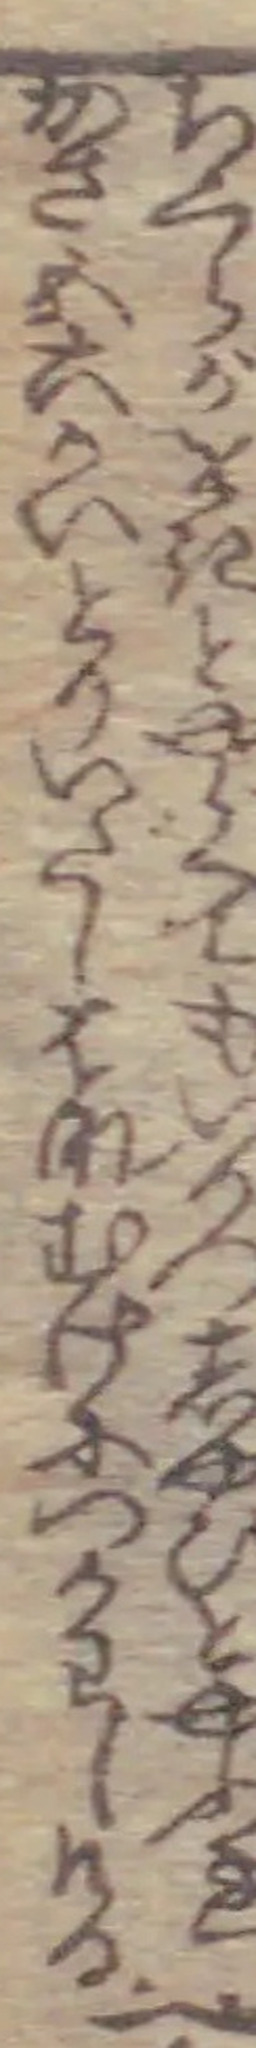かさ五六かいとりいだしはなむけにつかわしける

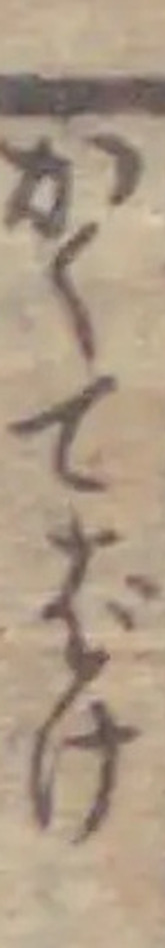かくてばけ
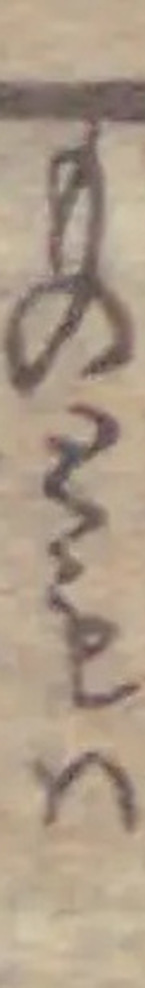ものともは
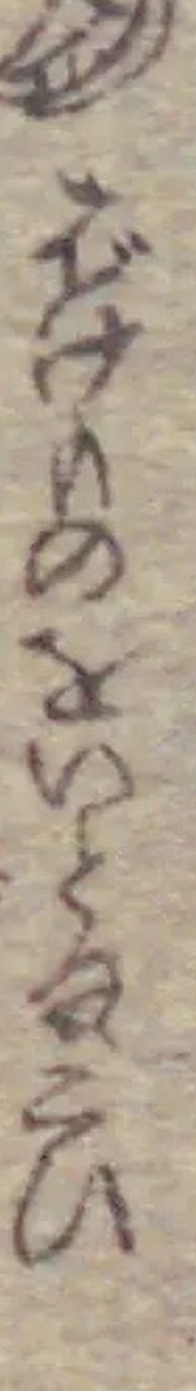ばけものをいとまこひ
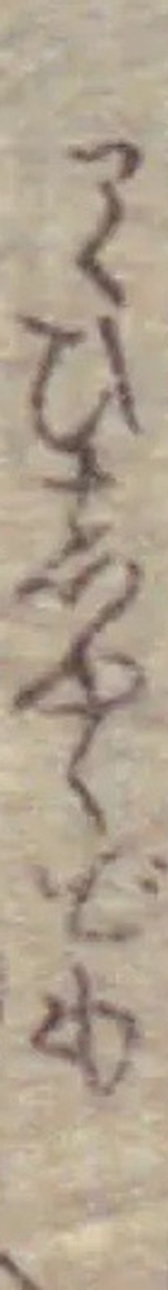アヽひしやくでも
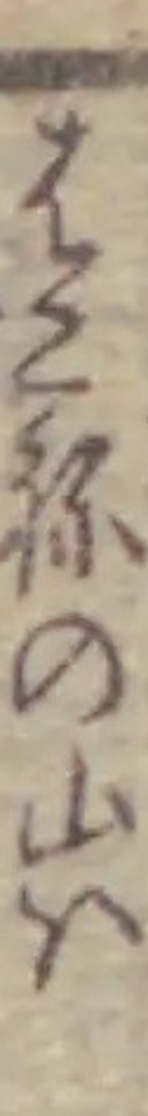はこねの山は
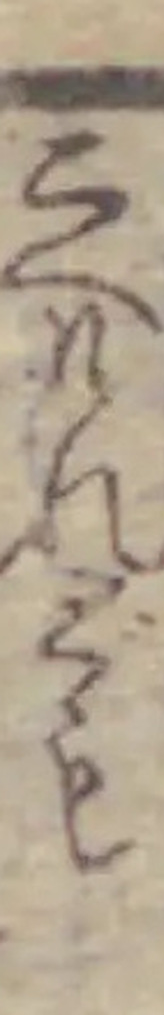こへけれども
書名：化物大閉口 2巻
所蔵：国立国会図書館 National Diet Library, JAPAN
